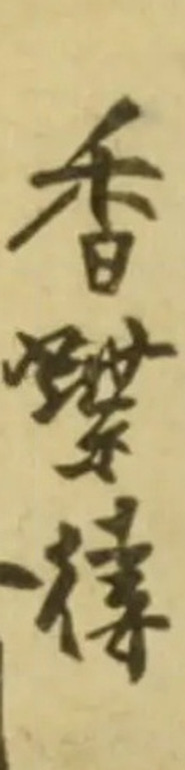香蝶楼
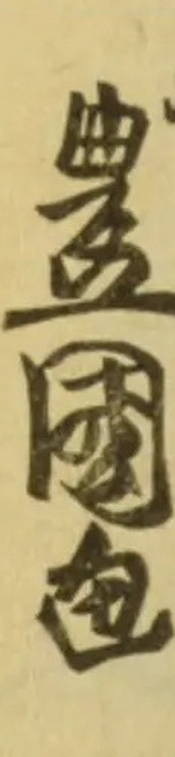豊国画
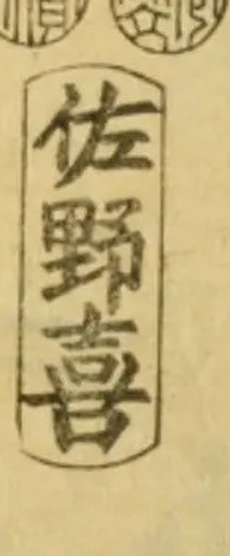佐野喜
